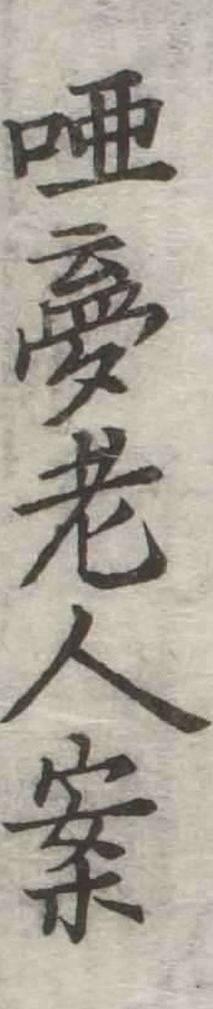唖夢老人案

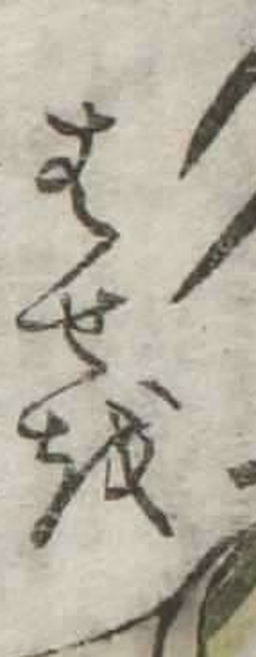はせを
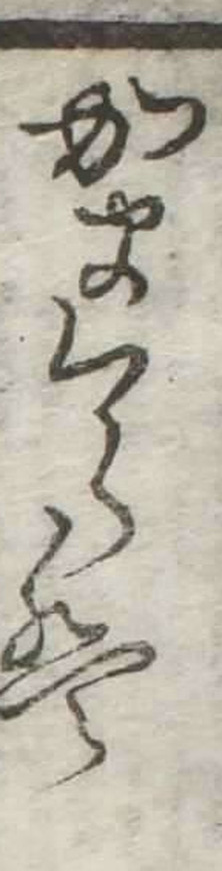かまくらは
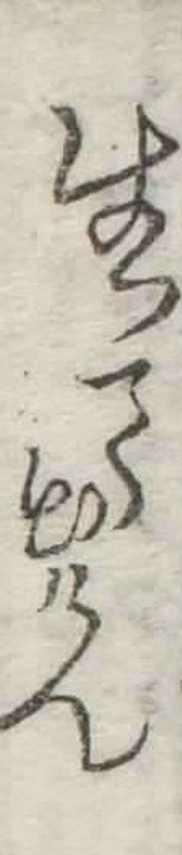生て出けん
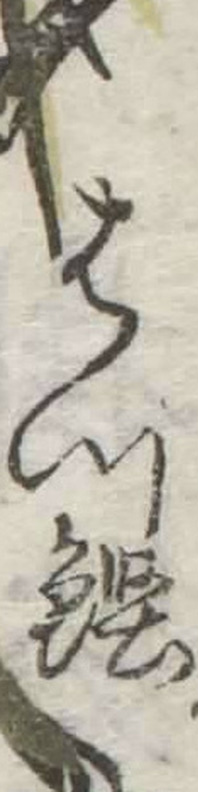はつ鰹
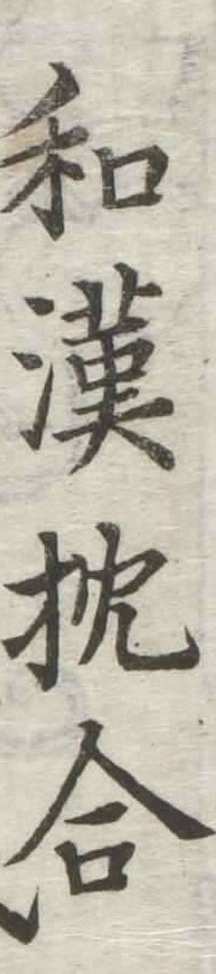和漢枕合
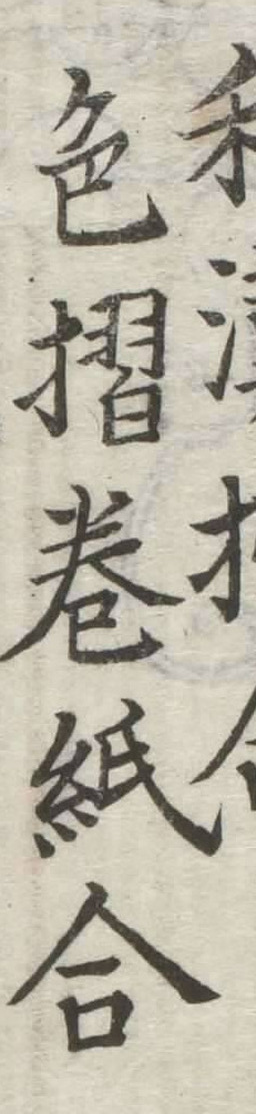色摺巻紙合
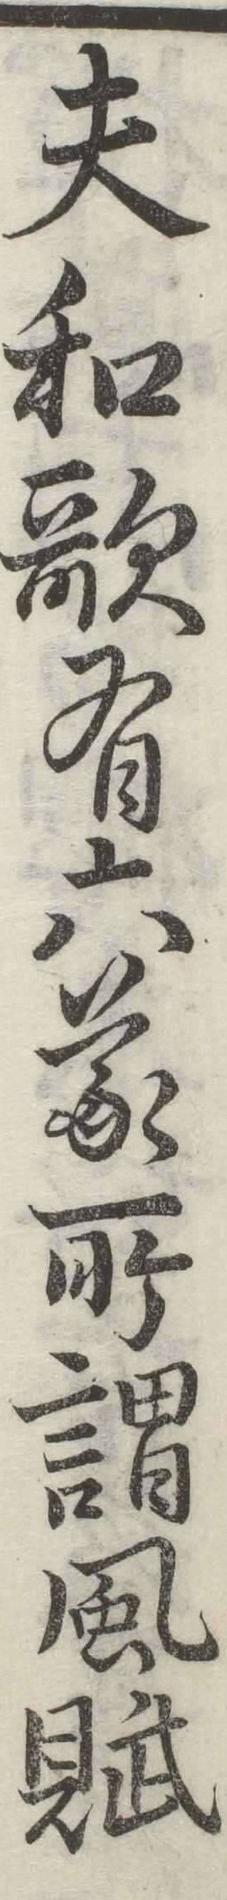夫和歌有六義所謂風賦
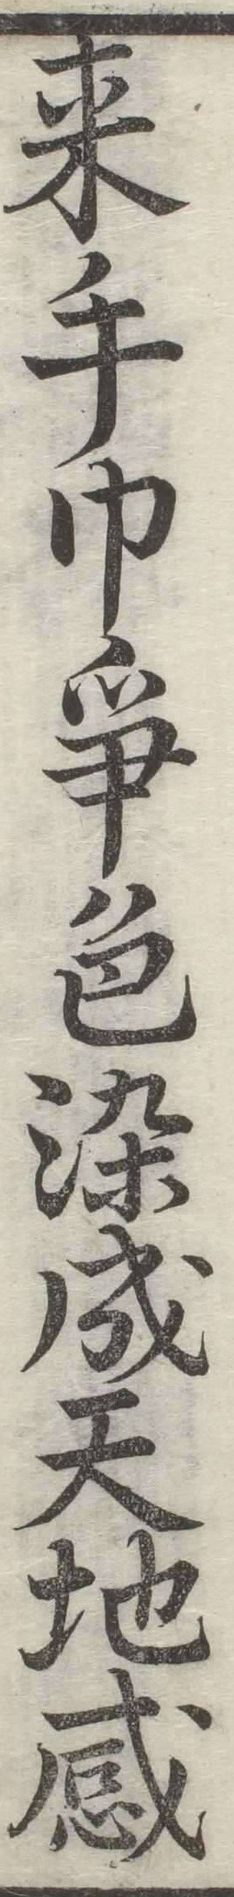来手巾争色染成天地感
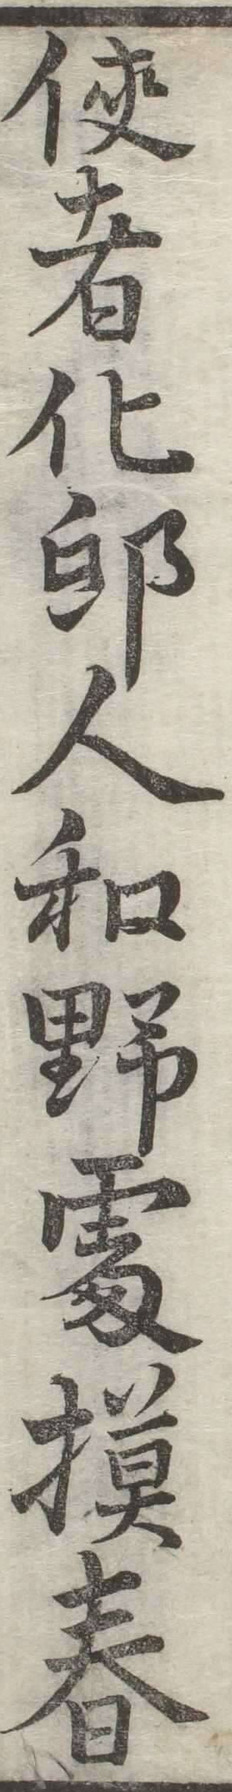侠者化郎人和野処摸春
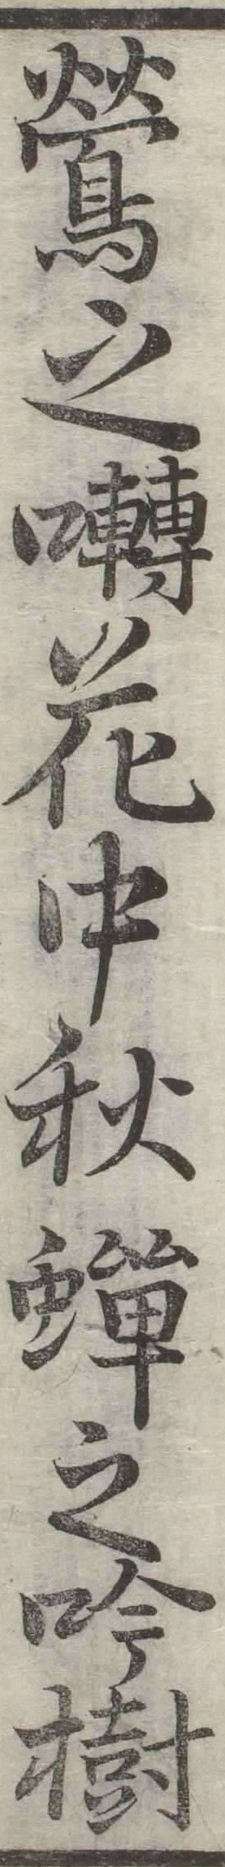鶯之囀花中秋蝉之吟樹

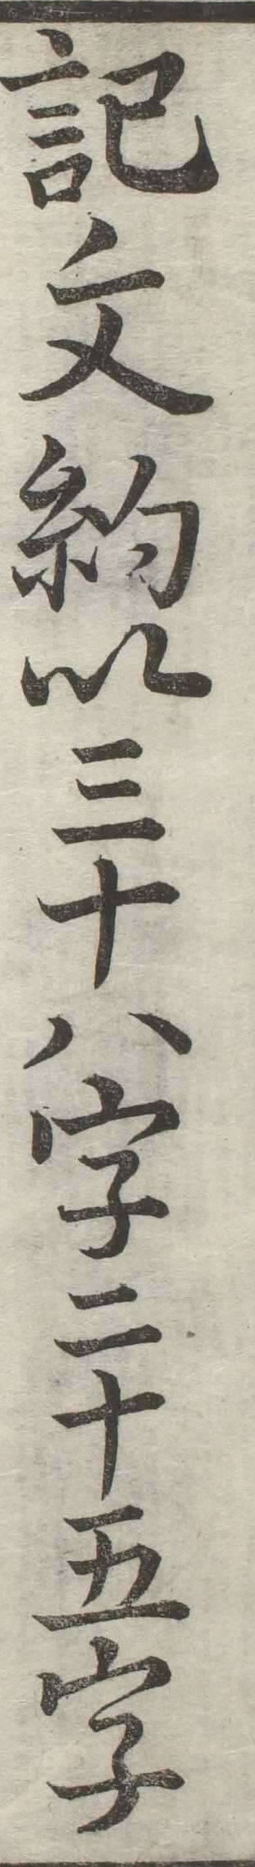記文約以三十八字二十五字
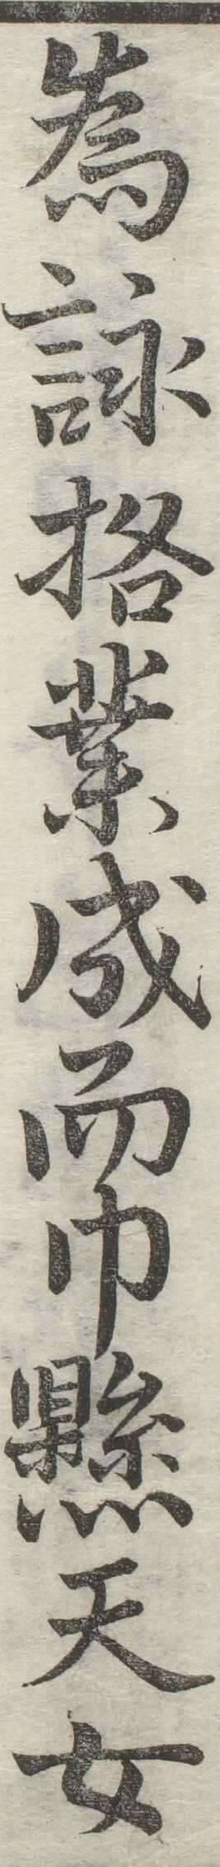為詠挌業成而巾懸天女
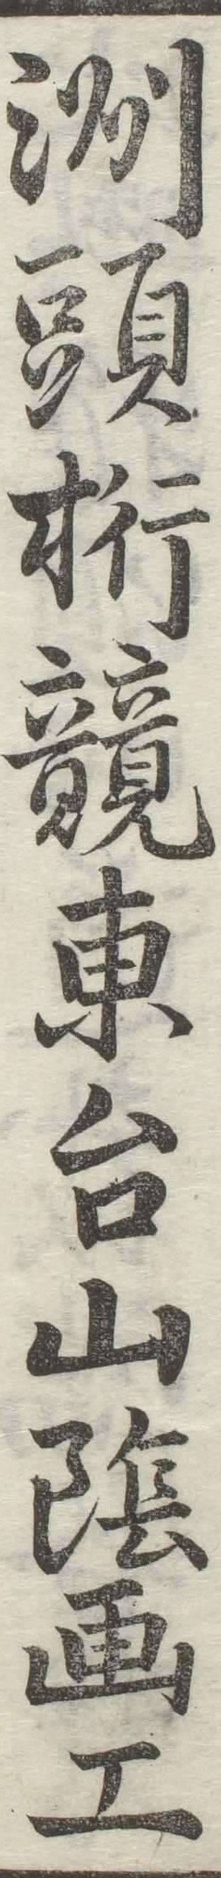洲頭桁競東台山陰画工
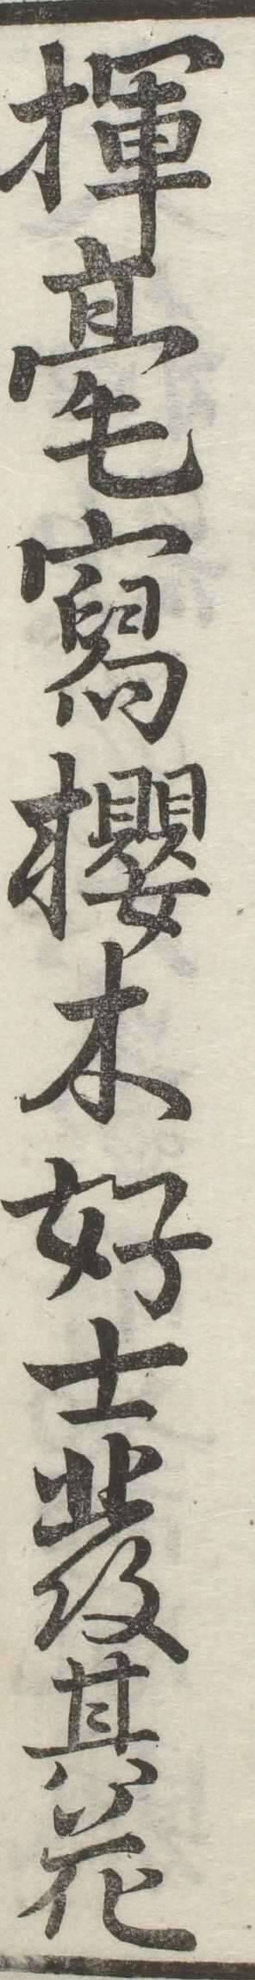揮毫写桜木好士発其花
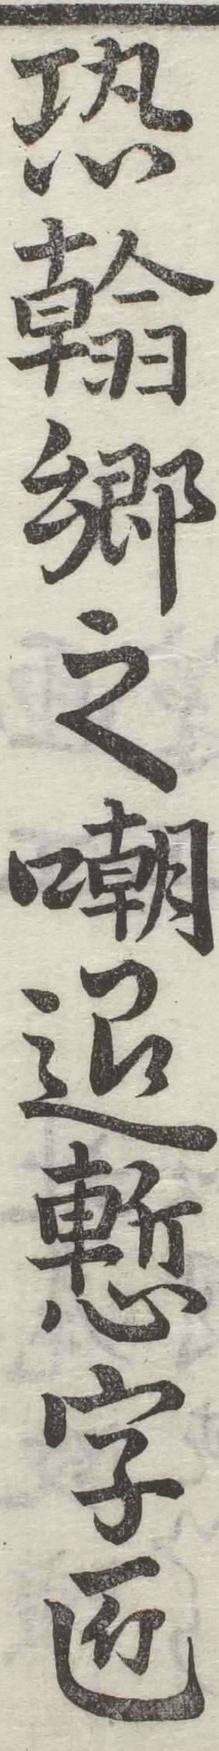恐翰郷之嘲退慙字匠
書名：たなくひあわせ
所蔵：国文学研究資料館
